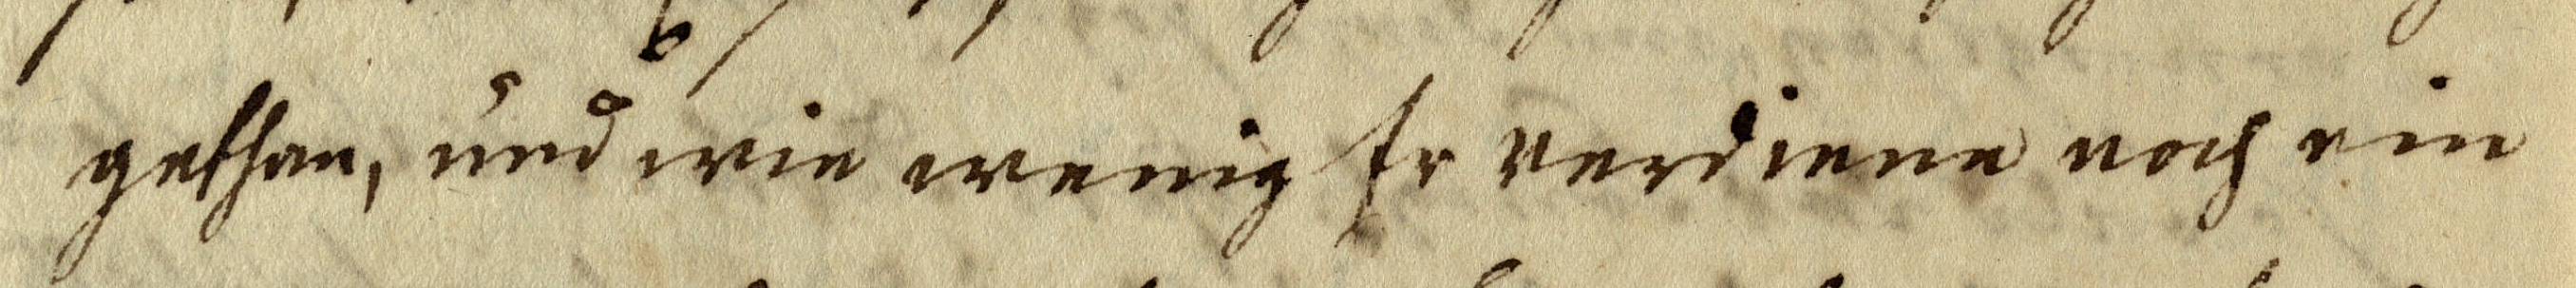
gethan, und wie wenig Er verdiene noch ein
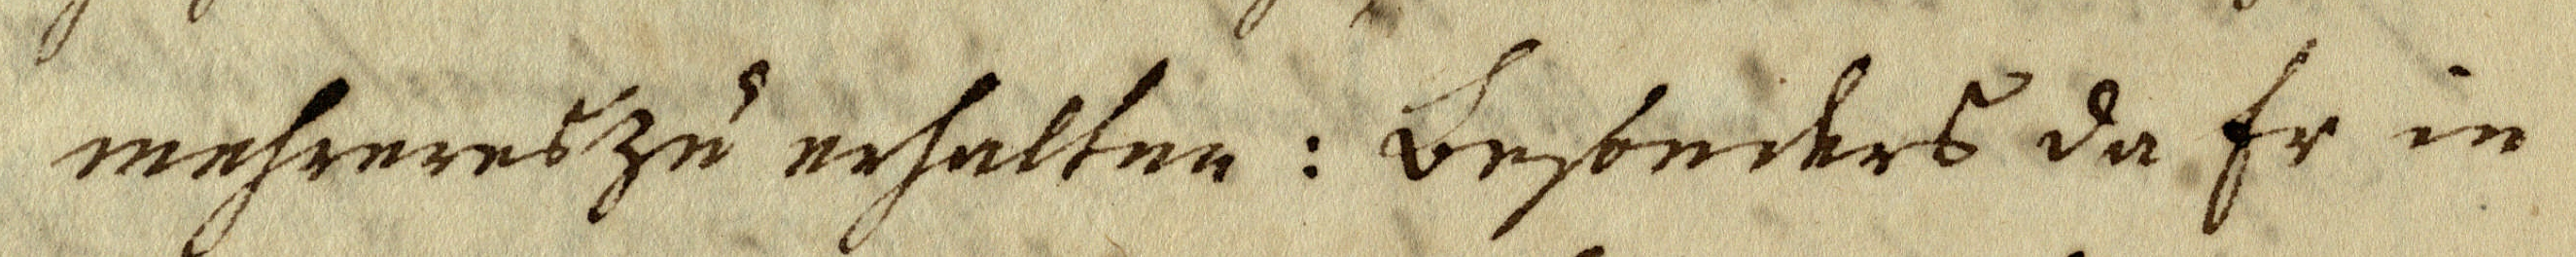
mehreres zu erhalten: Besonders da Er in
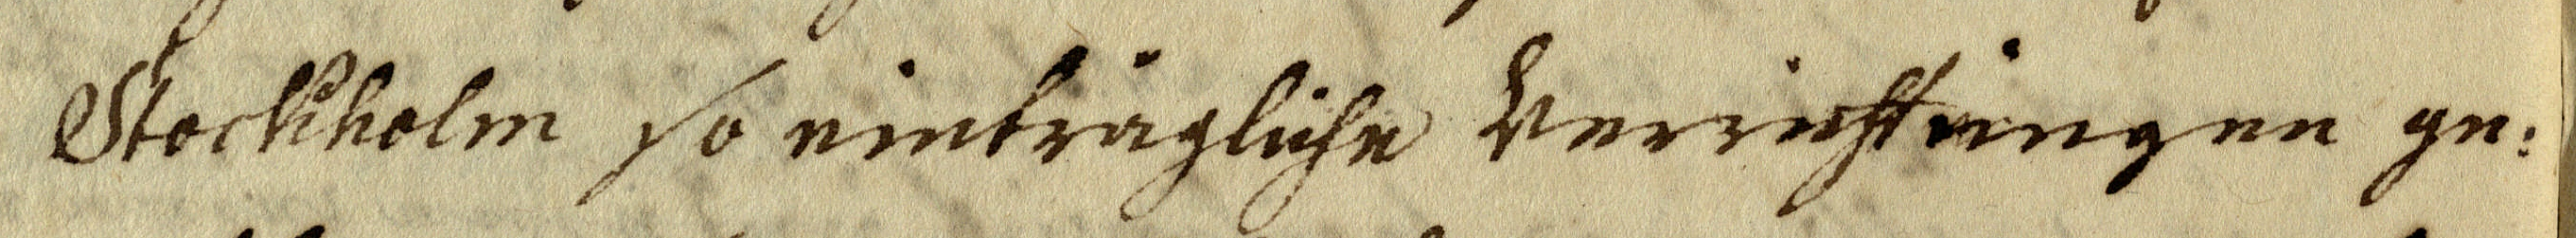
Stockholm so einträgliche Verrichtungen ge¬
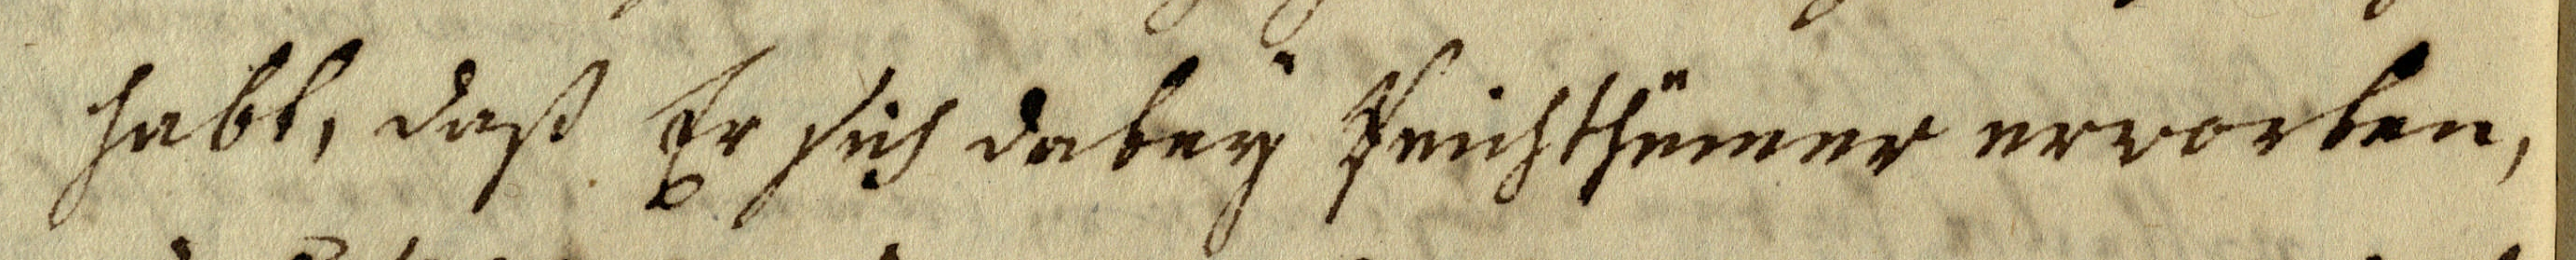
habt, daß Er sich dabeÿ Reichthümer erworben,
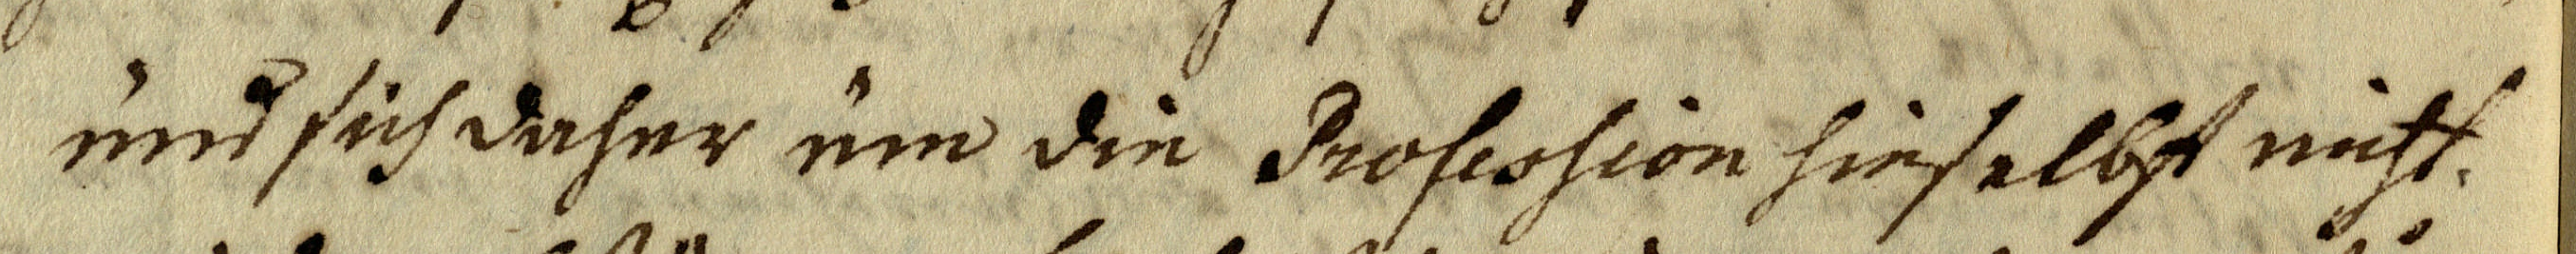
und sich daher um die Profession hieselbst nicht
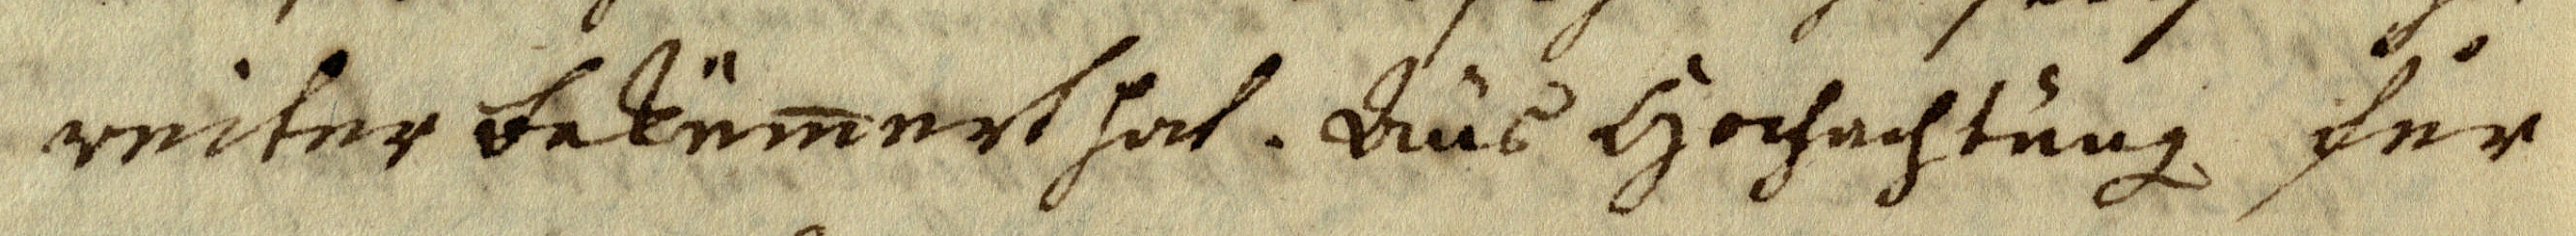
weiterbekümert hat. Aus Hochachtung für
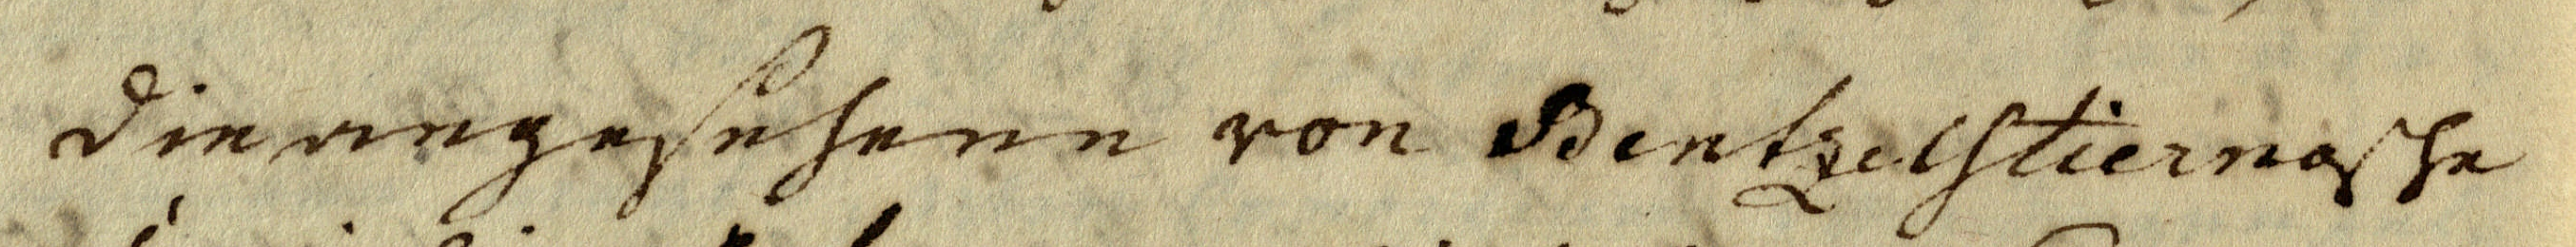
die angesehene von Bentzelstiernasche
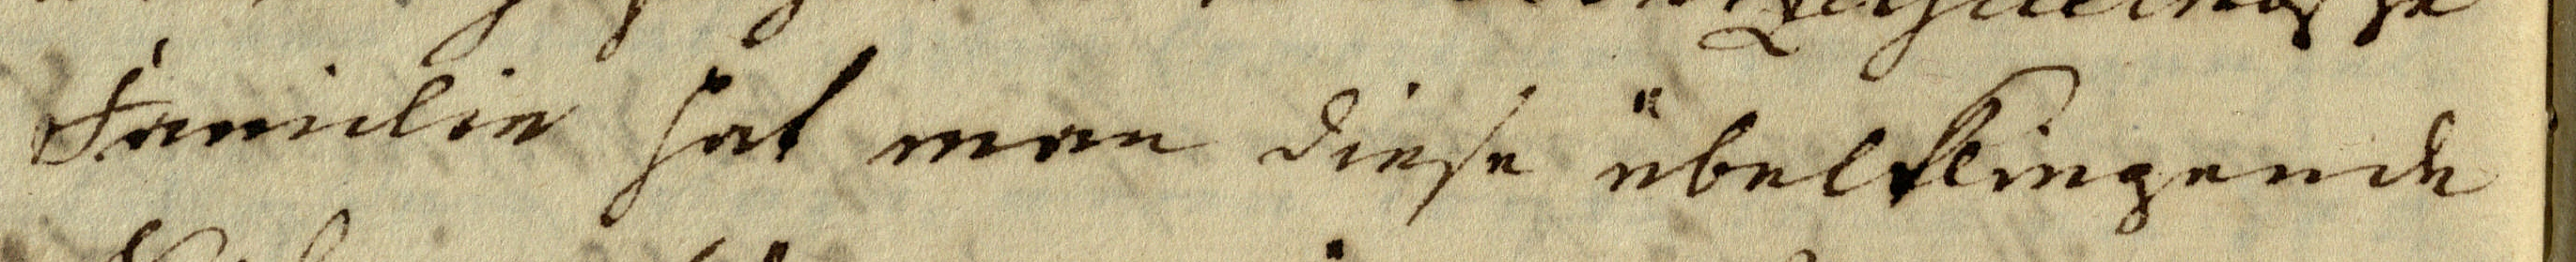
Familie hat man diese übelklingende
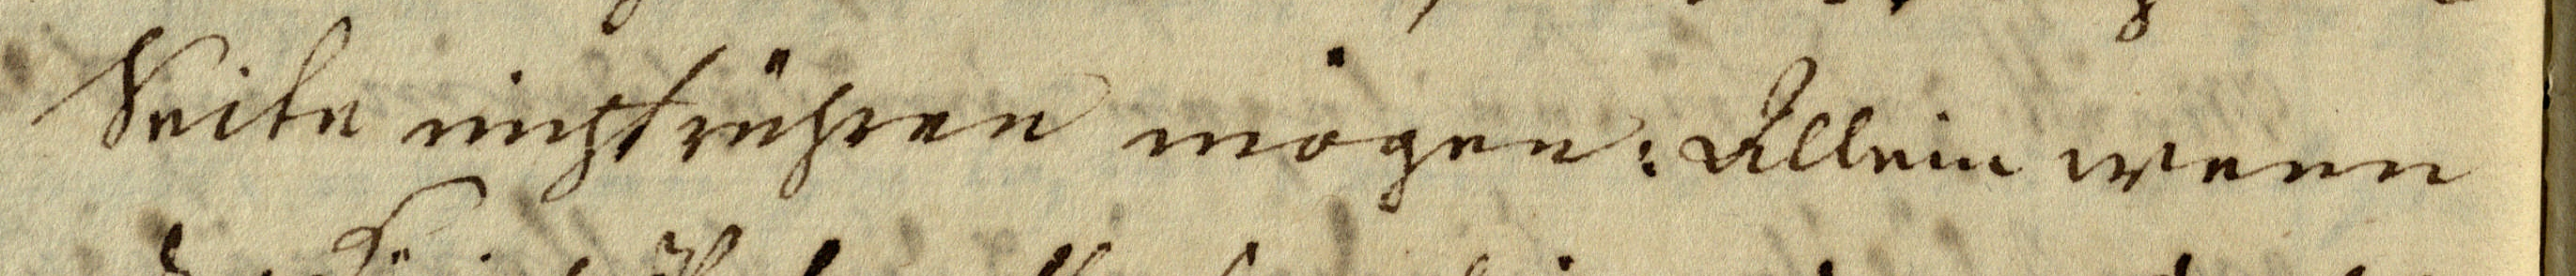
Seite nicht rühren mögen. Allein wenn
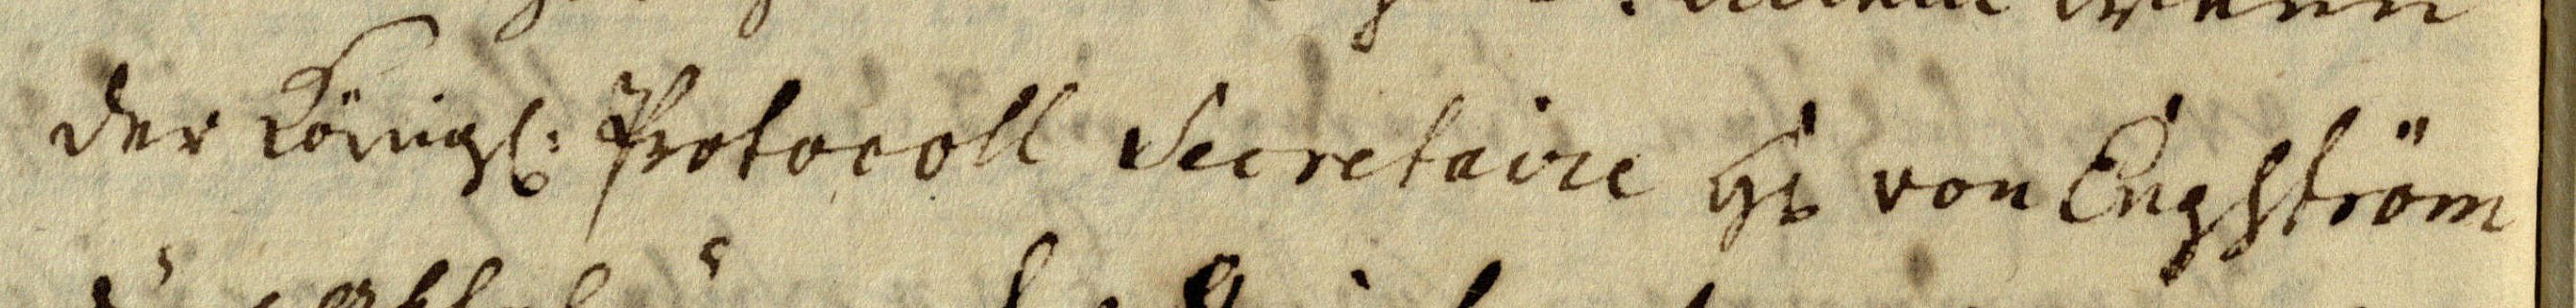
der Königl. Protocoll Secretaire H. von Engström
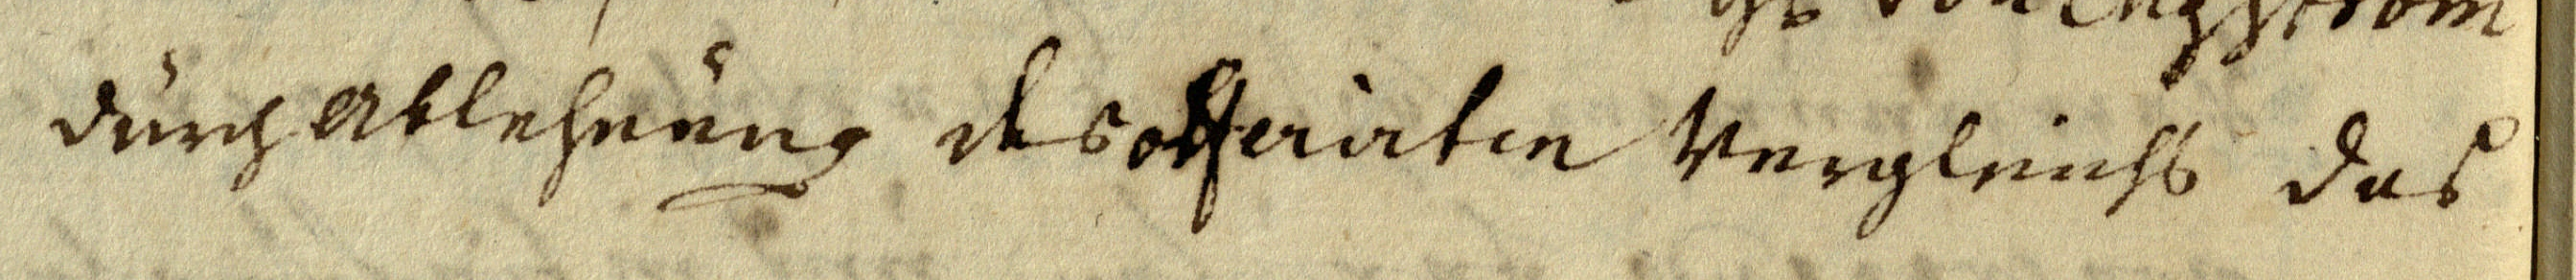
durch Ablehnung des offerirten Vergleichs das
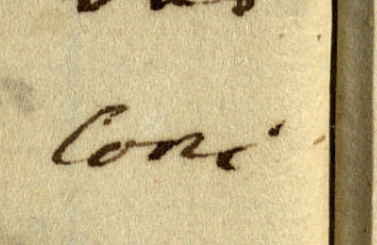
Coni
